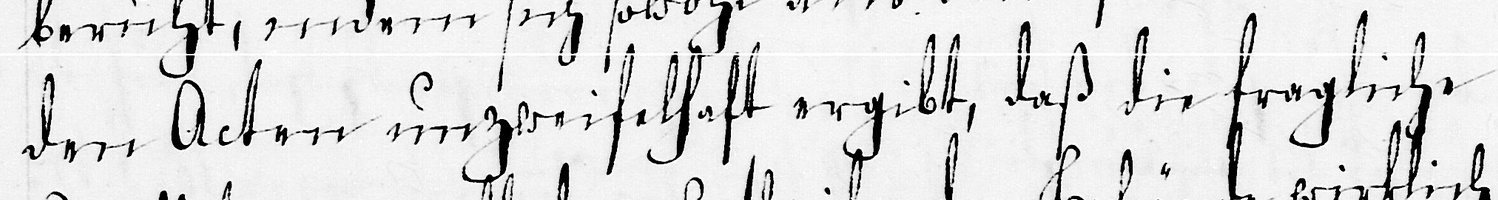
den Acten unzweifelhaft ergibt, daß die fragliche
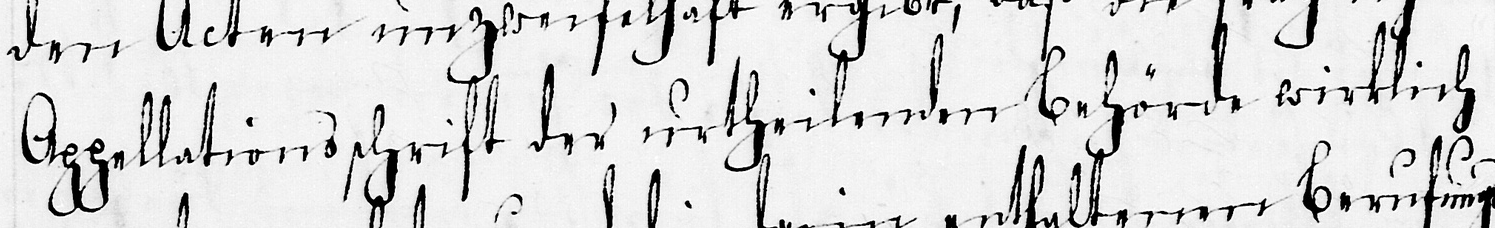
Appellationsschrift der urtheilenden Behörde wirklich
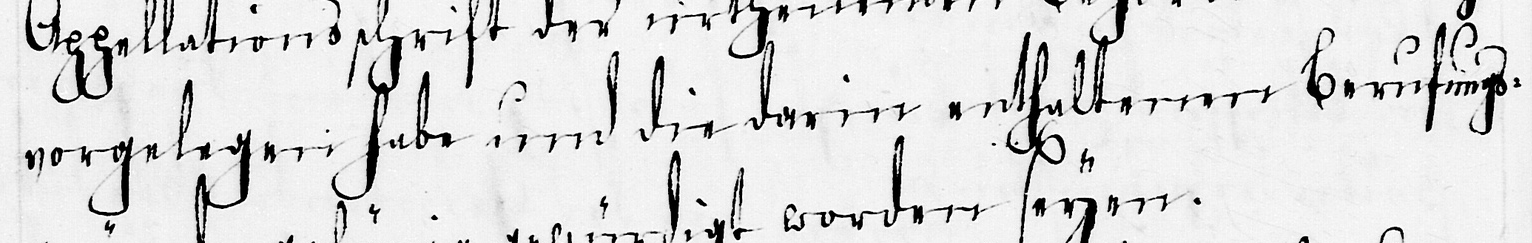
vorgelegen habe und die darin enthaltenen Berufung¬
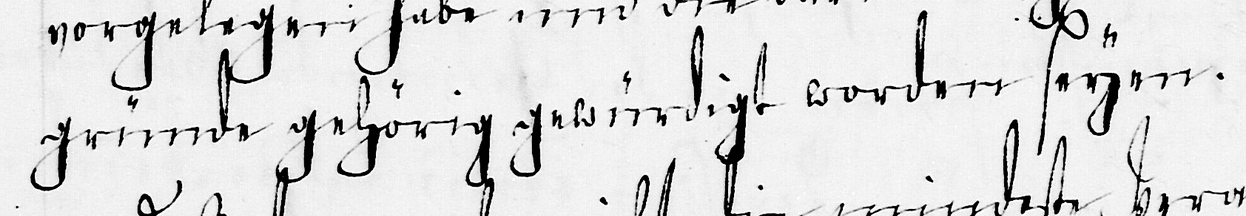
sgründe gehörig gewürdigt worden seyen.
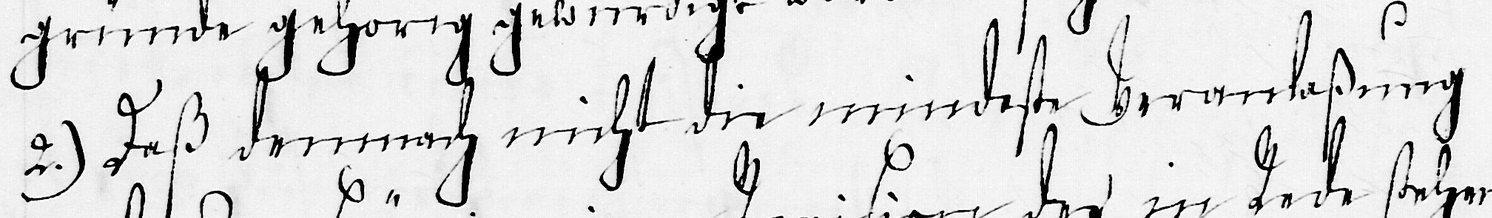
2.) Daß demnach nicht die mindeste Veranlaßung
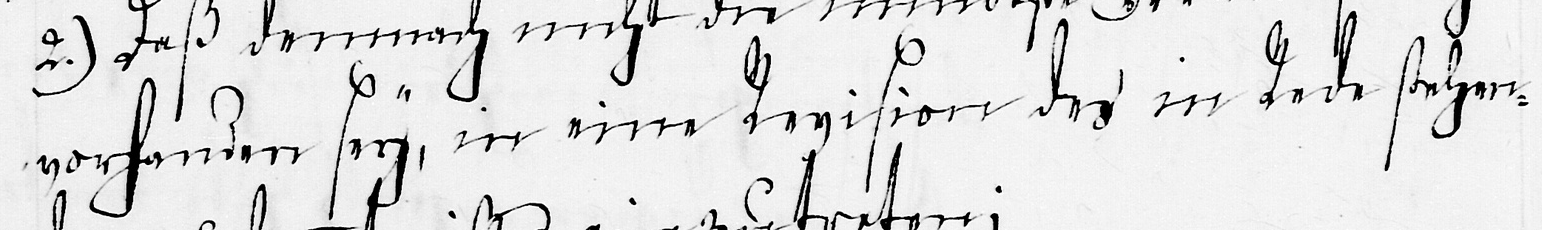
vorhanden sey, in eine Revision des in Rede stehen¬
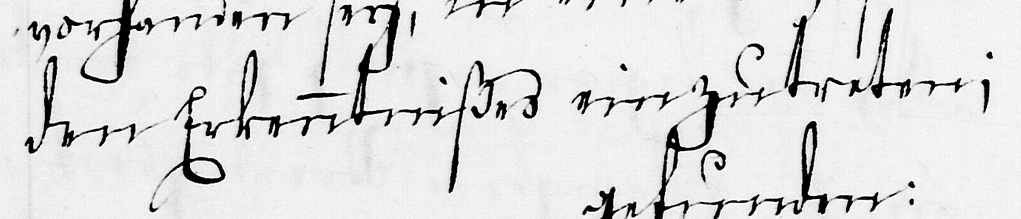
den Erkenntnißes einzutreten;
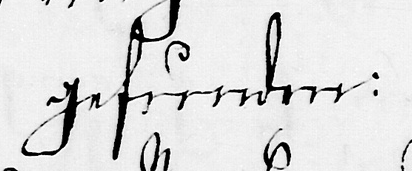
gefunden:
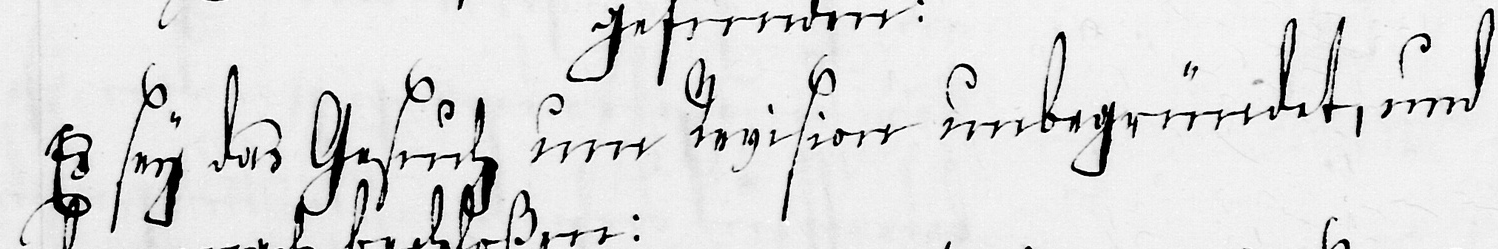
Es sey das Gesuch um Revision unbegründet, und
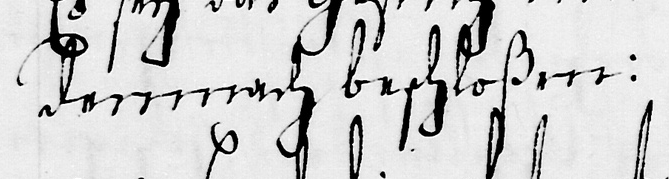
demnach beschloßen:
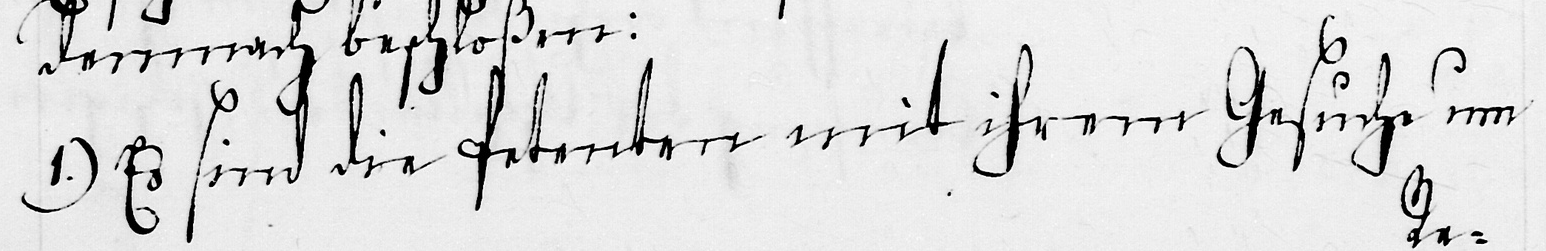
1.) Es sind die Petenten mit ihrem Gesuche um
